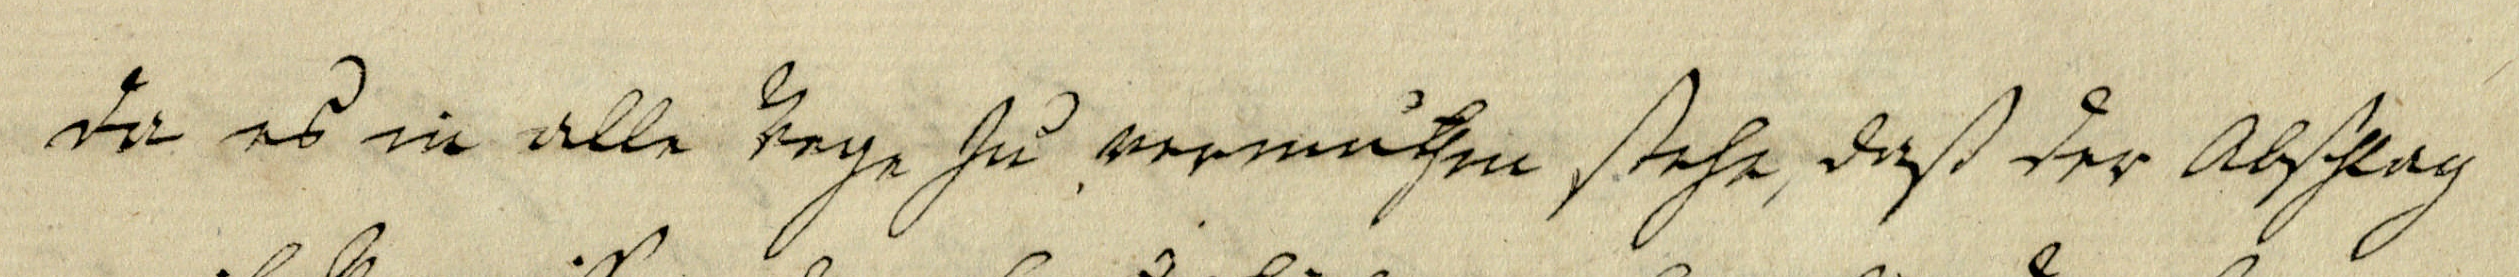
da es in alle Wege zu vermuthen stehe, daß der Abschlag
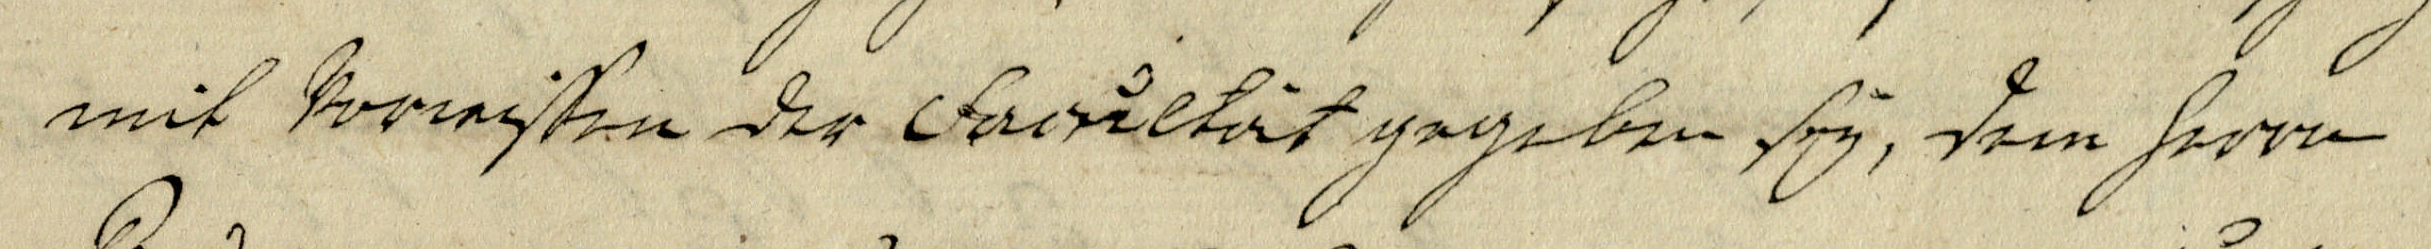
mit Vorwissen der Facultät gegeben seÿ, dem Herrn
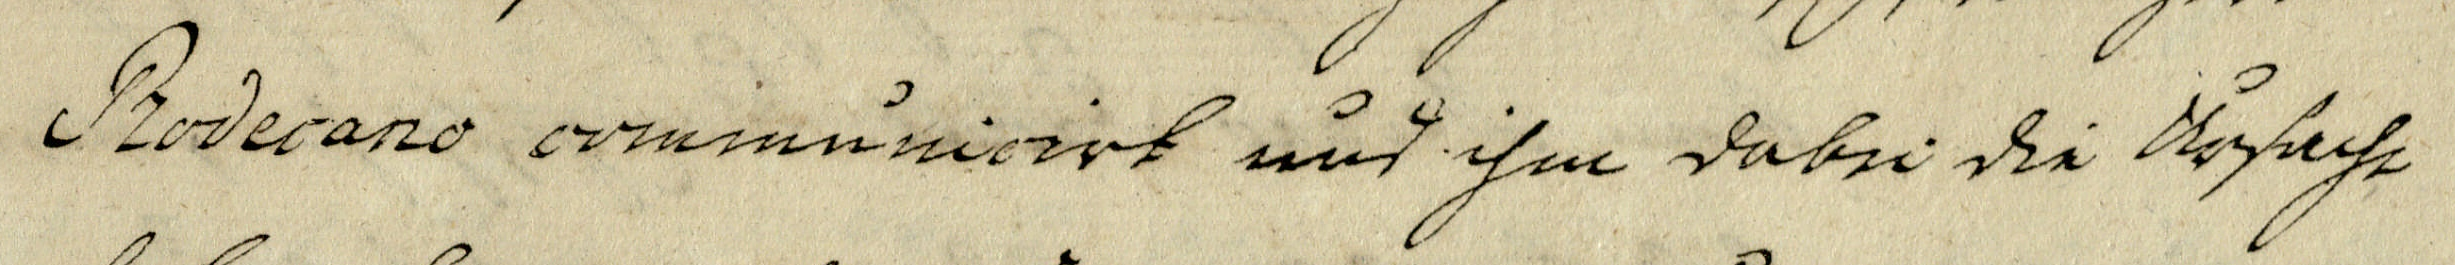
Prodecano communicirt und ihm dabei die Ursache
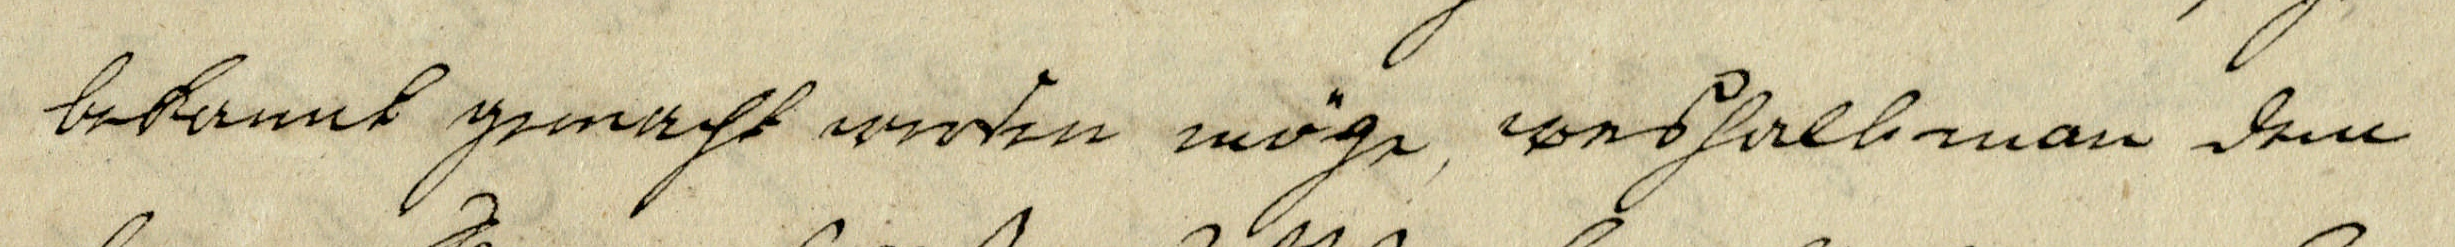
bekannt gemacht werden möge, weshlalb man dem
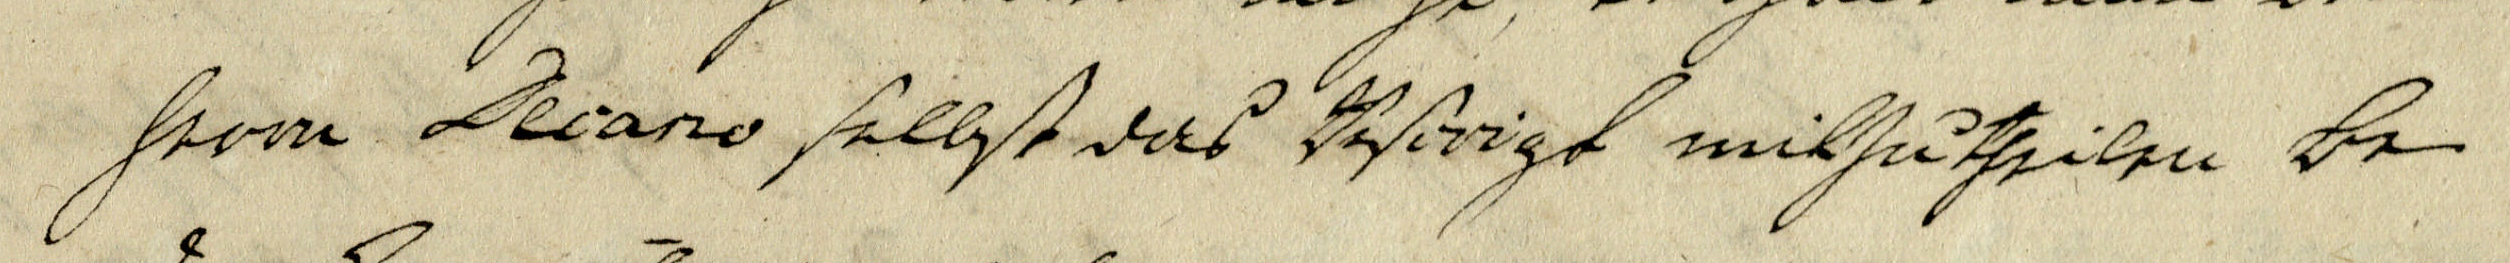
Herrn Decano selbst das Rescript mitzutheilen Be¬
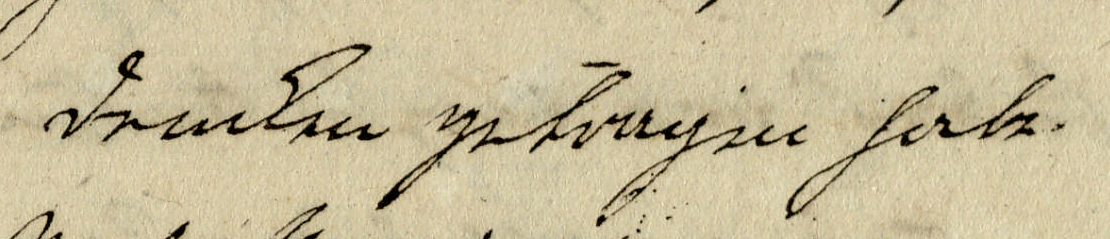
dencken getragen habe.
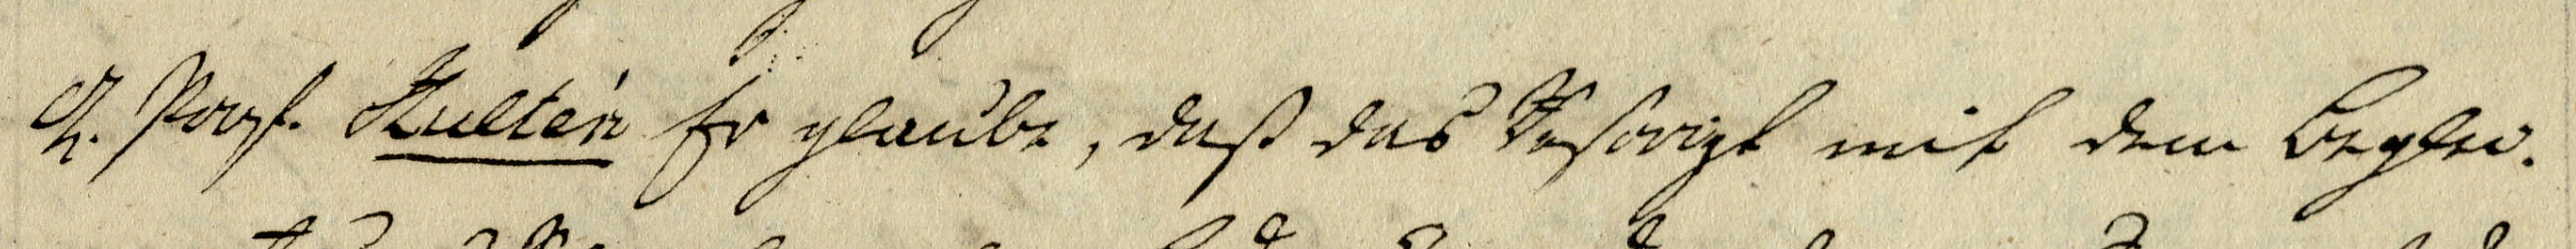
dh. Prof. Hultén Er glaube, daß das Rescript mit dem Bestglei¬
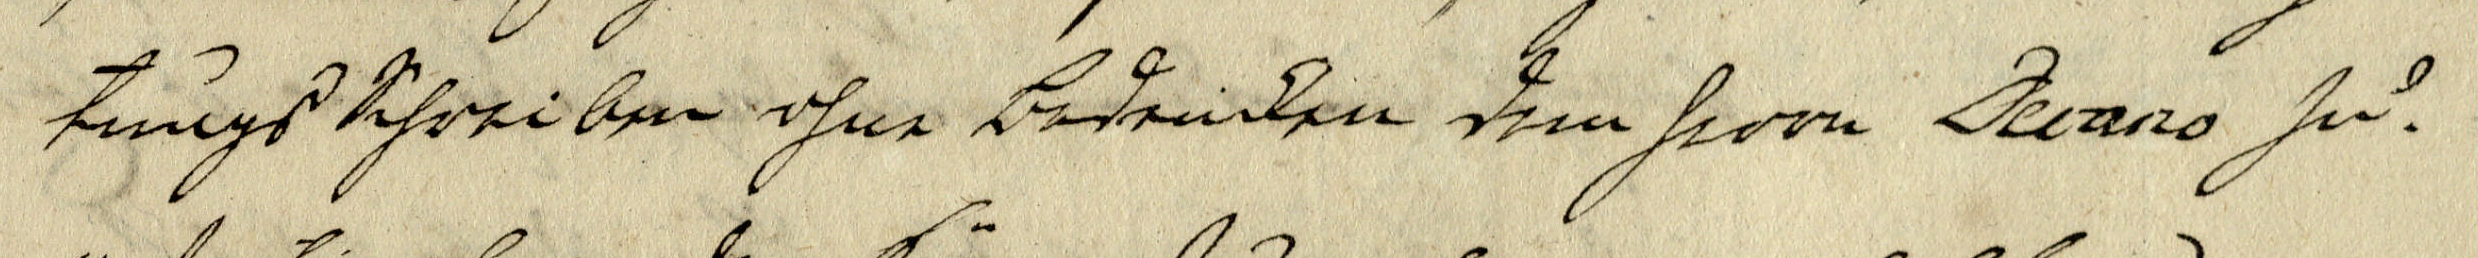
tungs Schreiben ohne Bedencken dem Herrn Decano zu¬
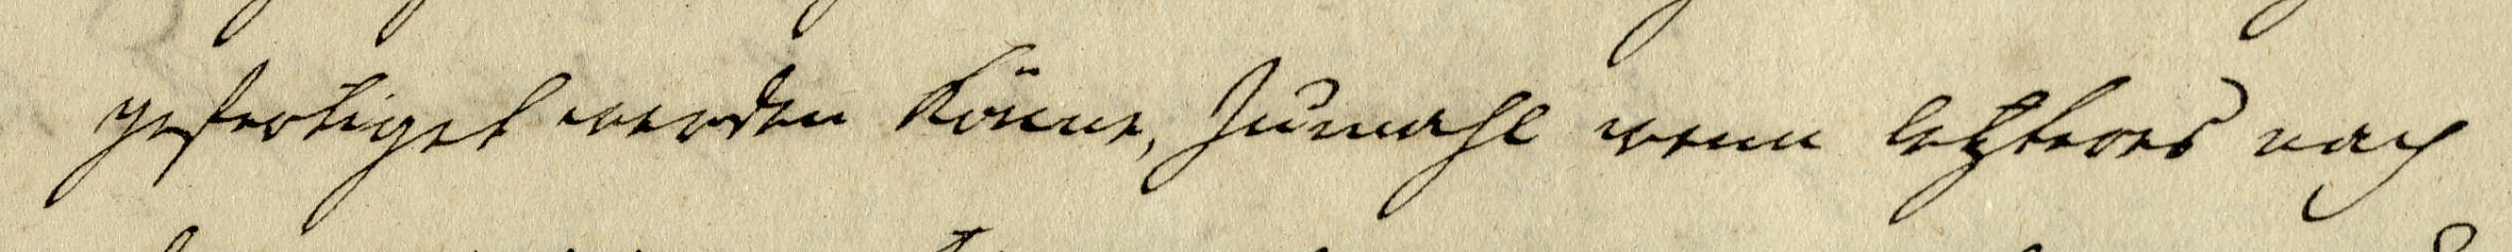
gefertiget werden könne, zumahl wenn letzteres nach
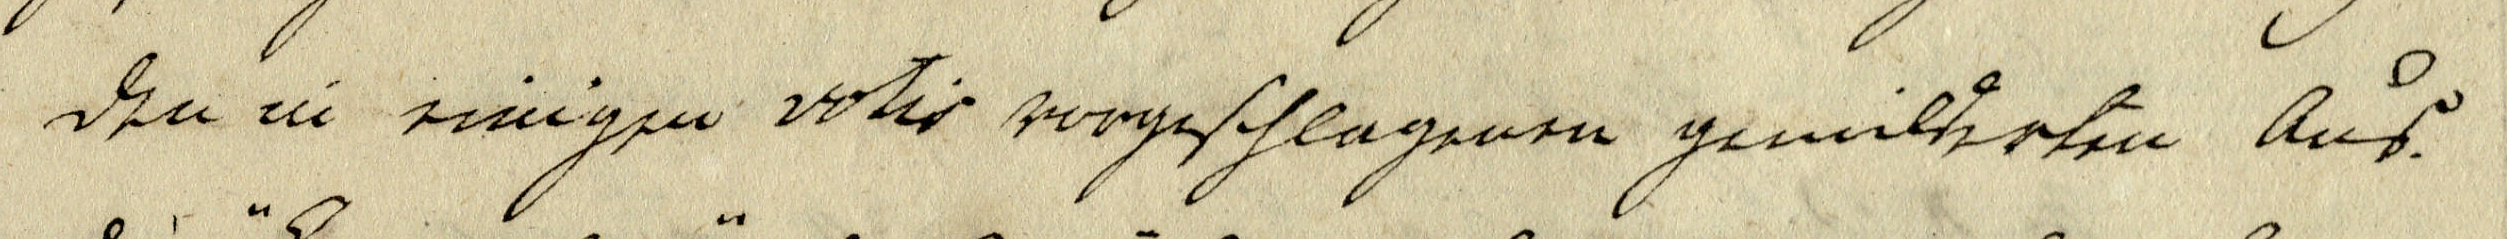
den in einigen votis vorgeschlagenen gemilderten Aus¬
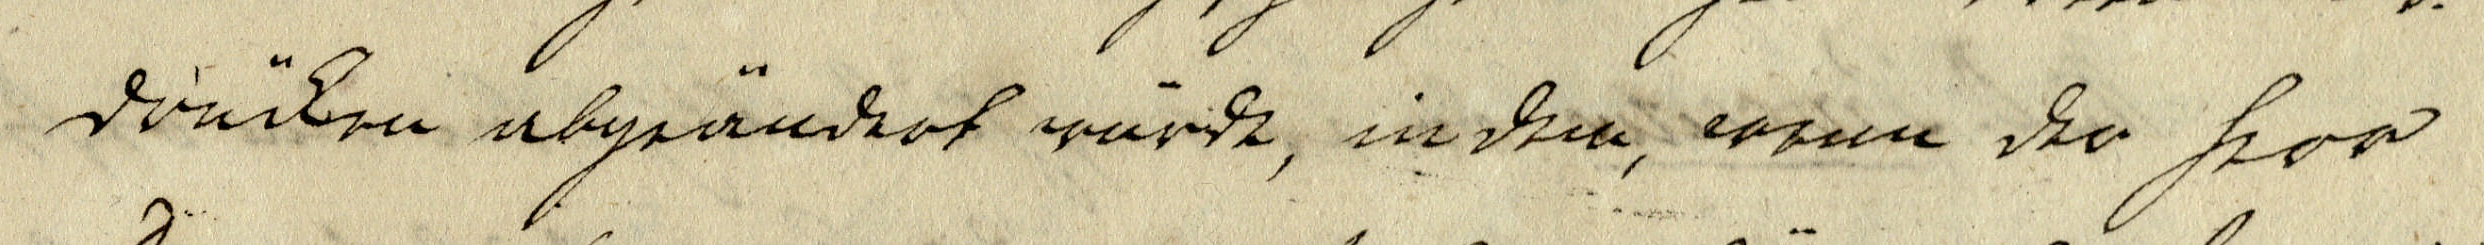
drücken abgeändert würde, in dem, wenn der Herr
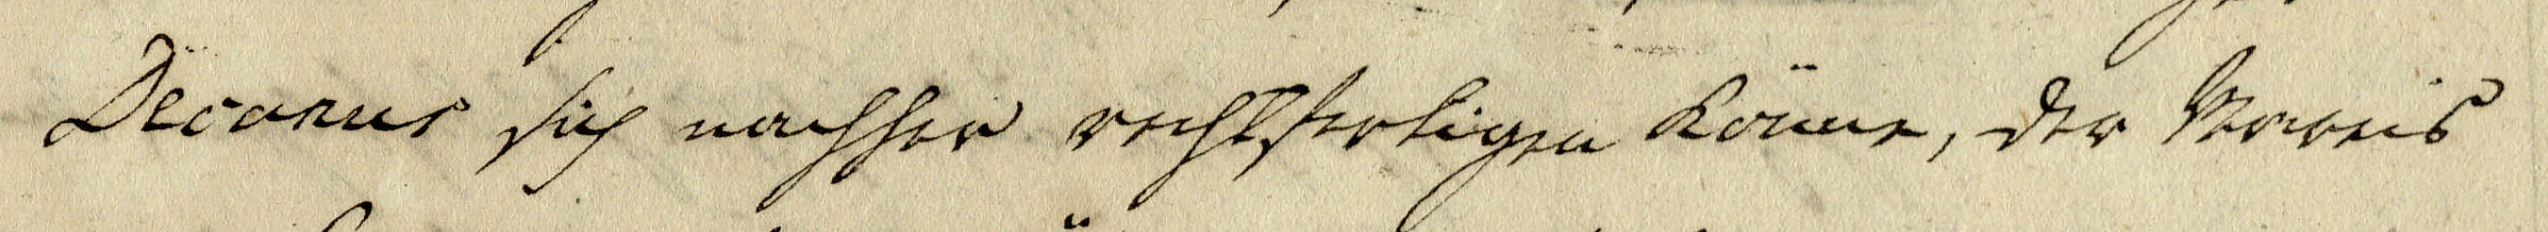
Decanus sich nachher rechtfertigen könne, der Verweis
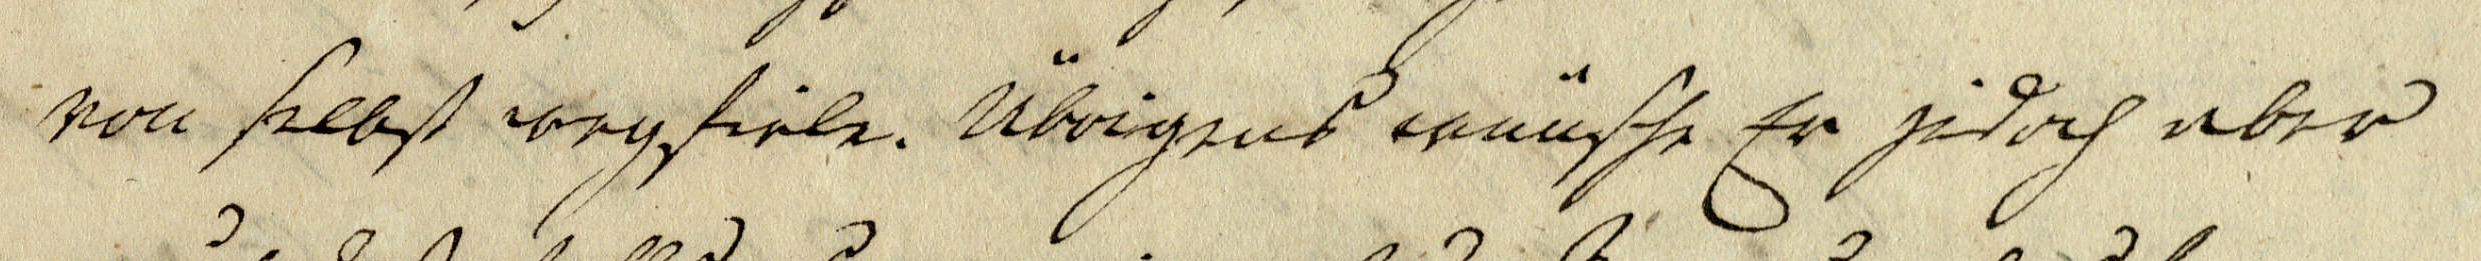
von selbst wegfiele. Übrigens wünsche Er jedoch aber
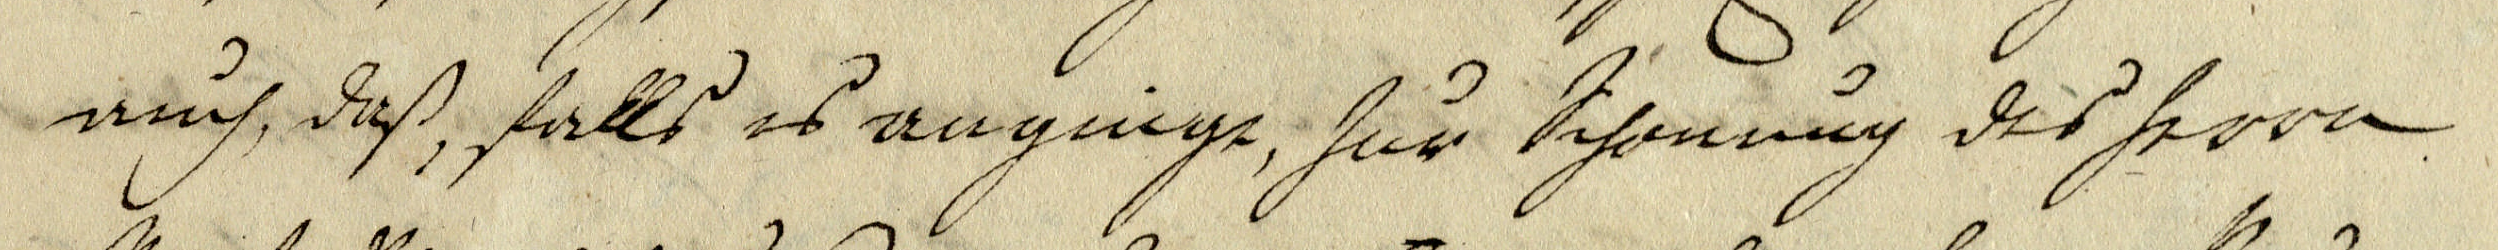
auch, daß, falls es anginge, zur Schonung des Herrn
